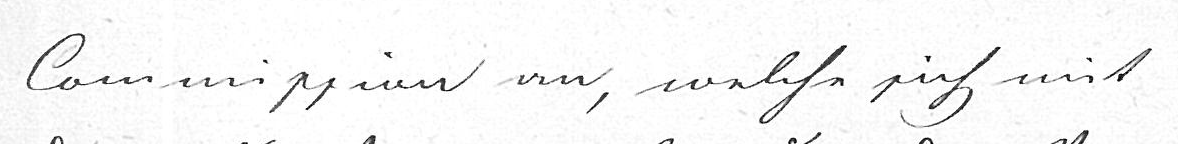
Commission an, welche sich mit
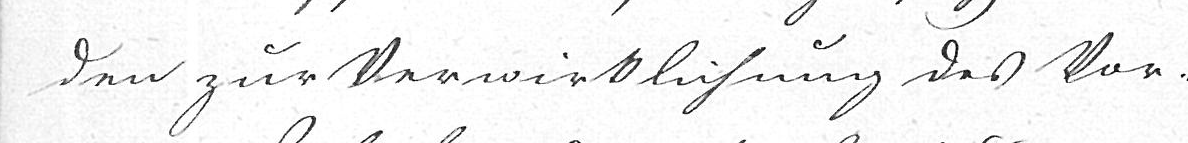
den zur Verwirklichung des Vor-
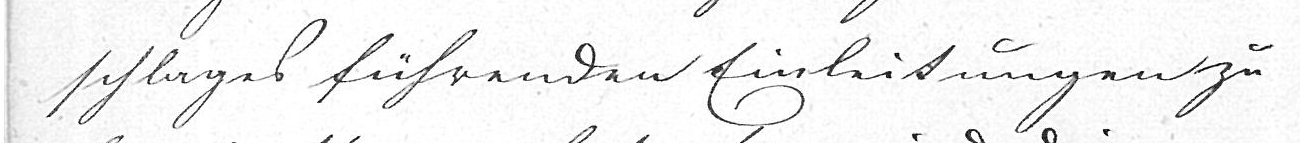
schlages führenden Einleitungen zu
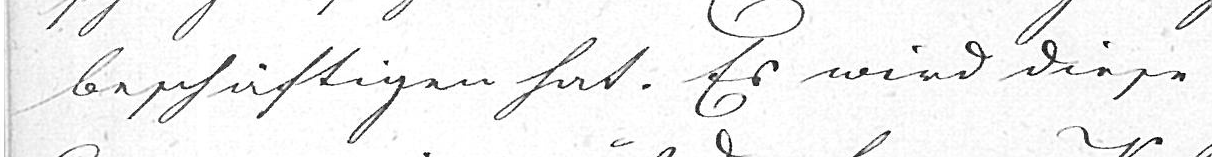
beschäftigen hat. Es wird diese
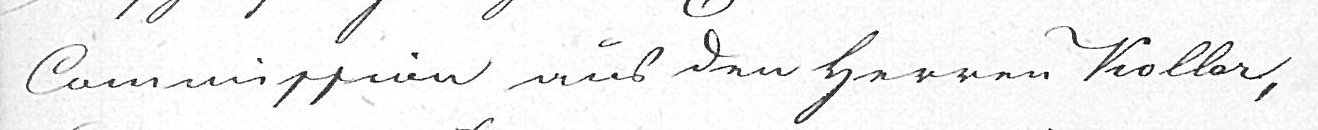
Commission aus den Herren Koller,
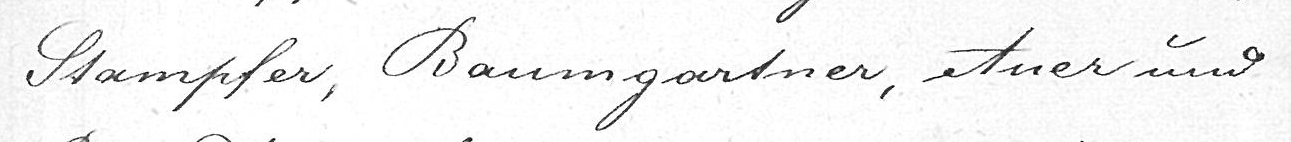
Stampfer, Baumgartner, Auer und
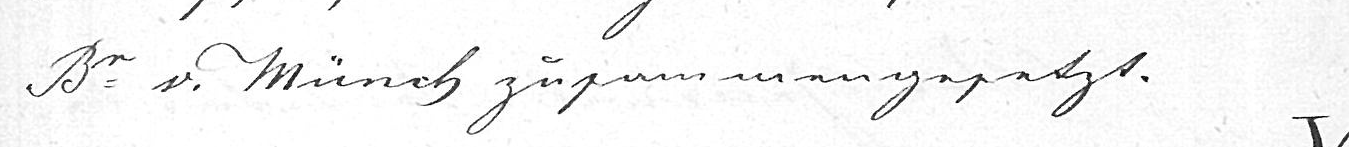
Br. v. Münch zummengesetzt.
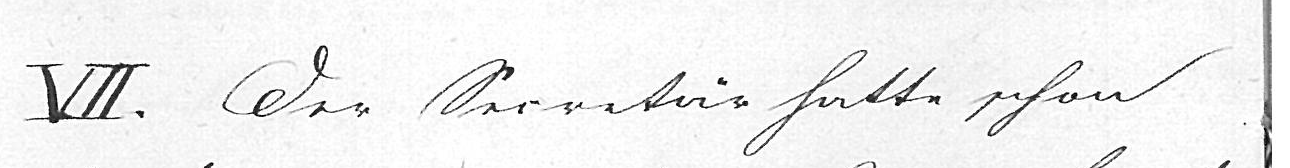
VII. Der Secretär hatte schon
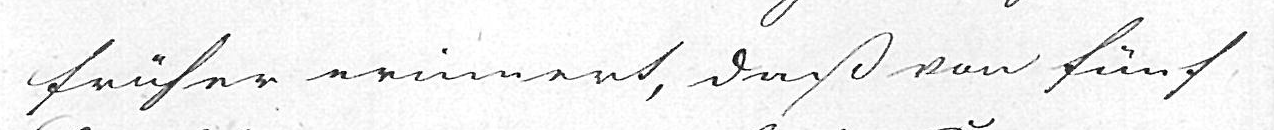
früher erinnert, daß von fünf
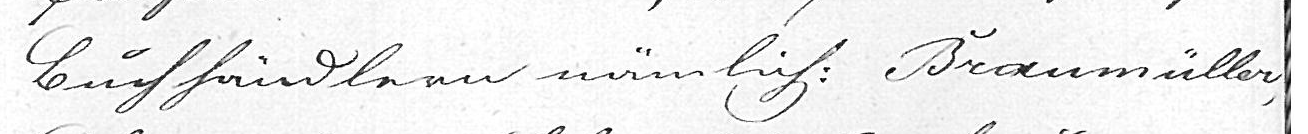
Buchhändlern nämlich: Braumüller,
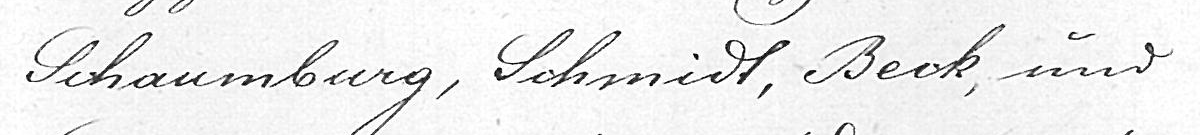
Schaumburg, Schmidt, Beck, und
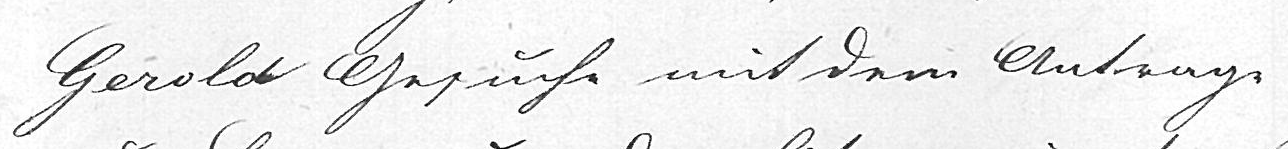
Gerold Gesuche mit der Antrage
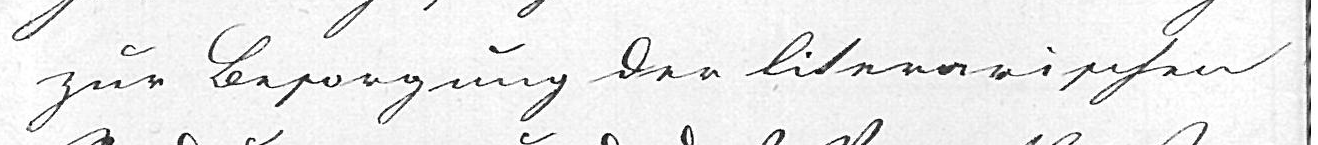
zur Besorgung der literarischen
